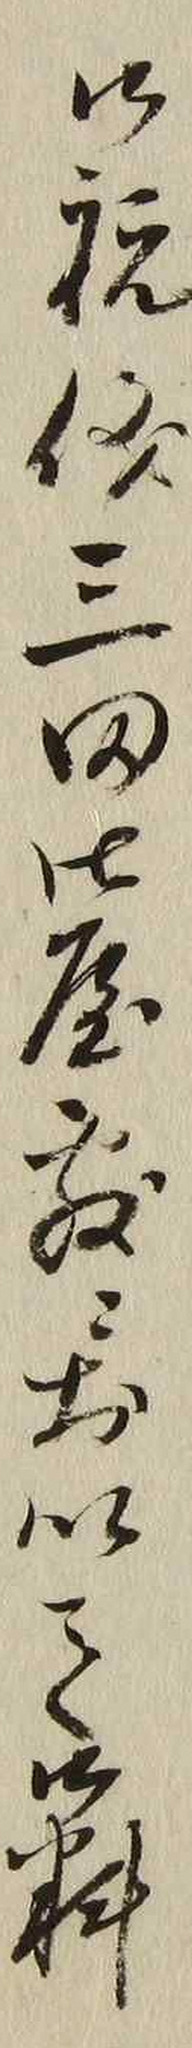御祝儀三田御屋敷ニおいて御料
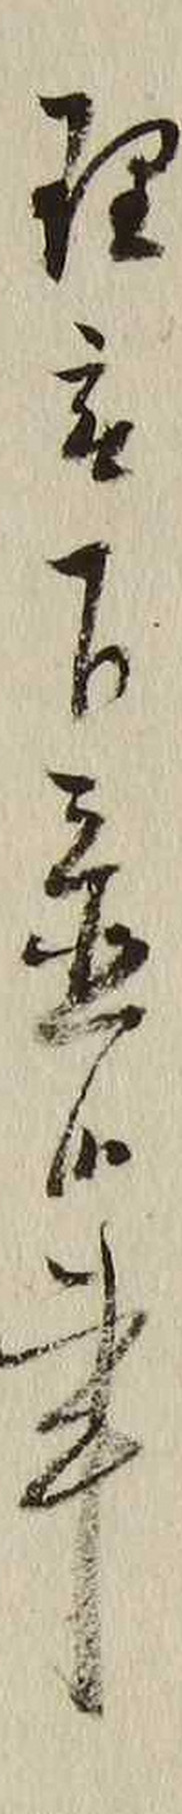理被下置候事
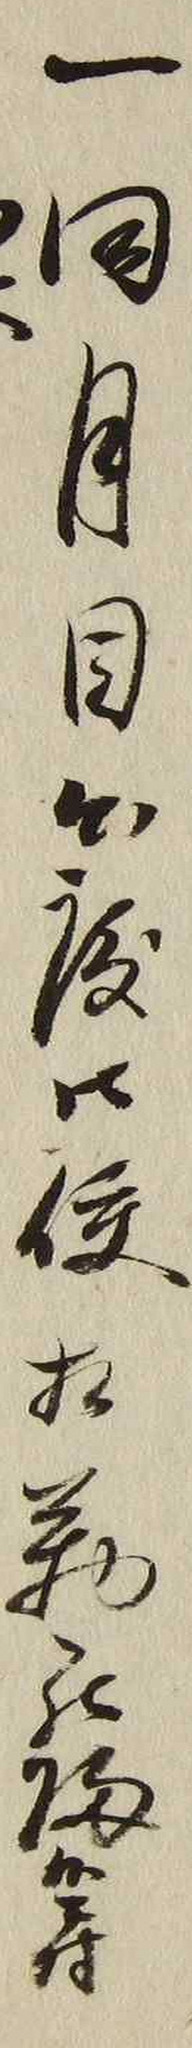一同月目出度御使相勤罷帰候ニ付
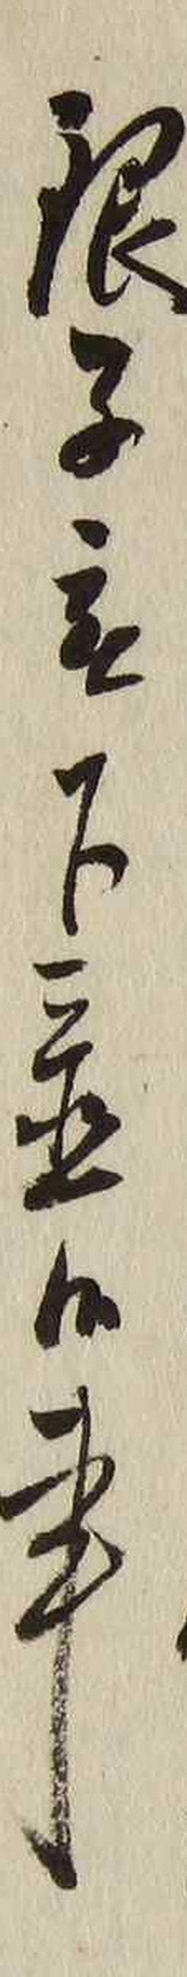銀子被下置候事
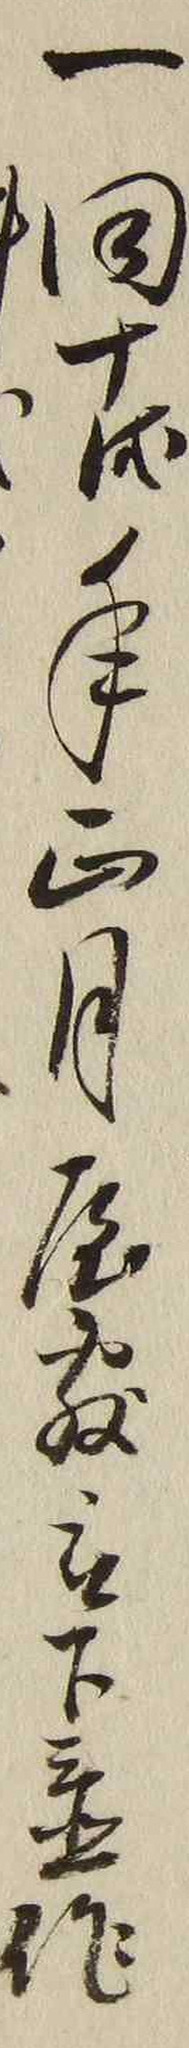一同十戌年正月屋敷被下置作
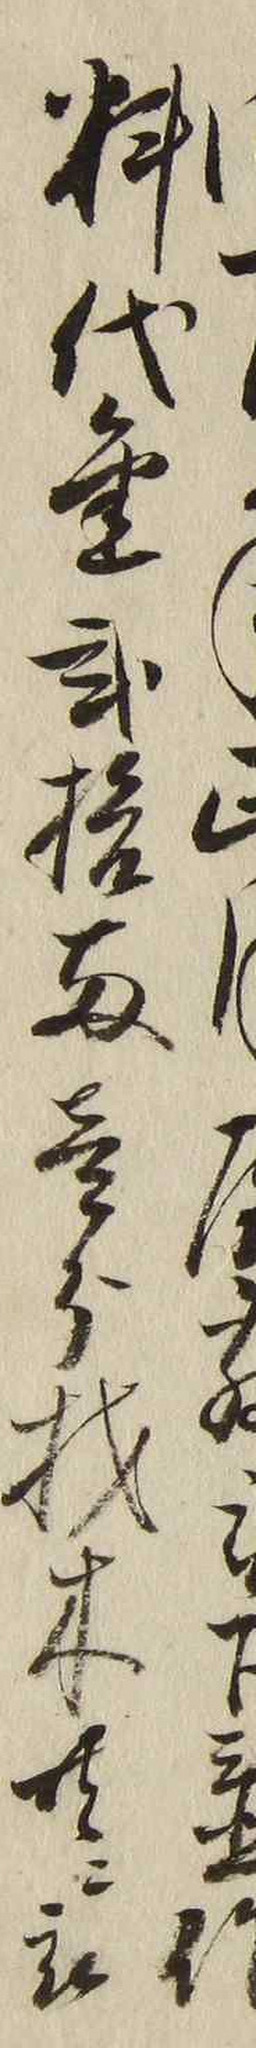料代金弐拾両壱分材木共ニ被

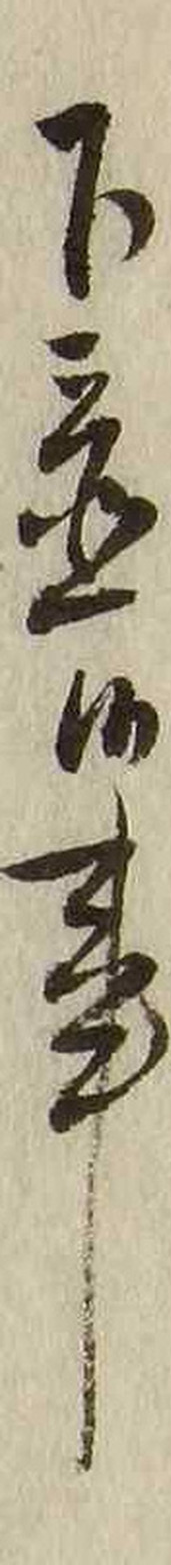下置候事
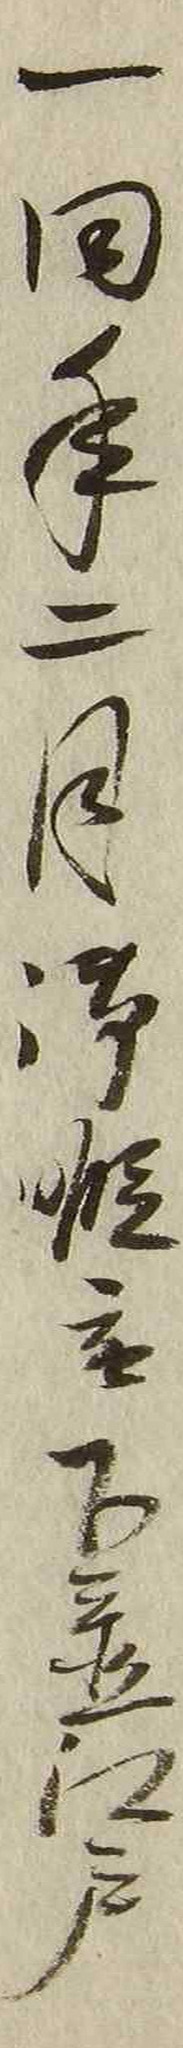一同年二月御暇被下置江戸
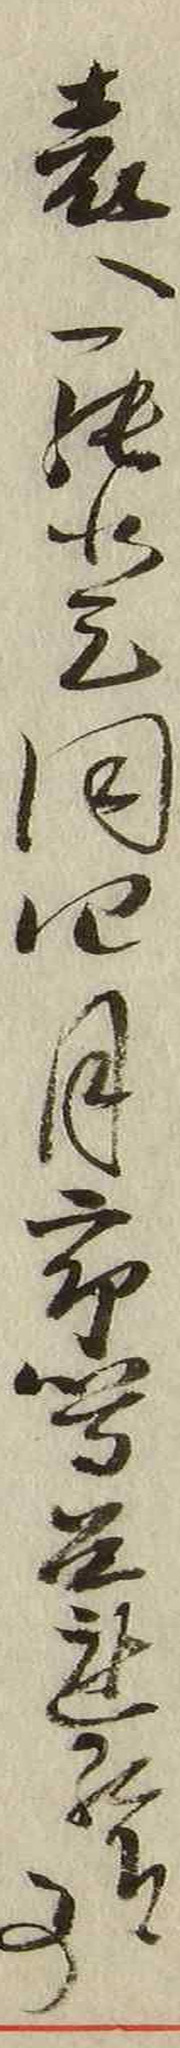表へ罷登同四月郎等召連罷下候事
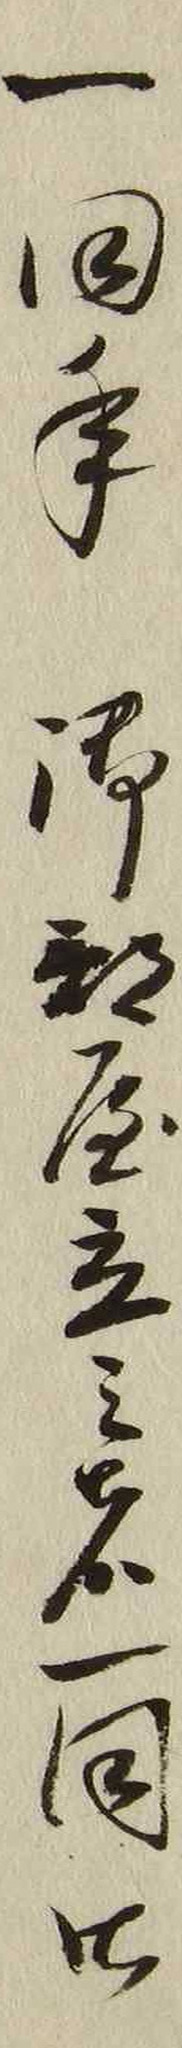一同年御部屋立之者一同御
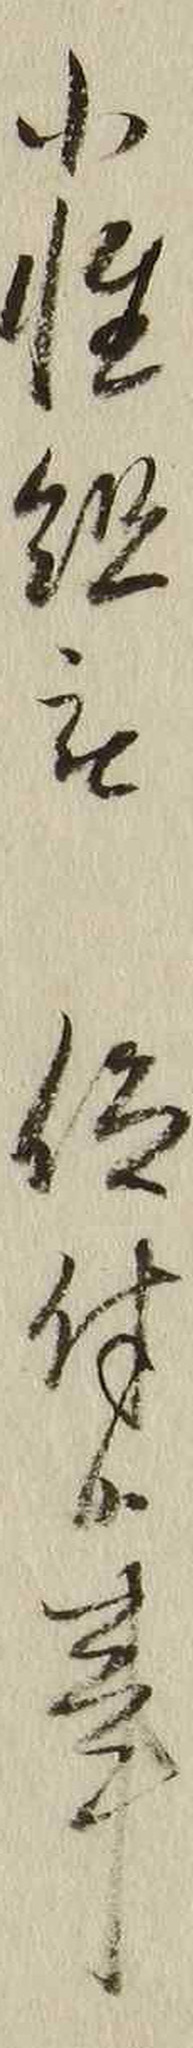小性組被仰付候事
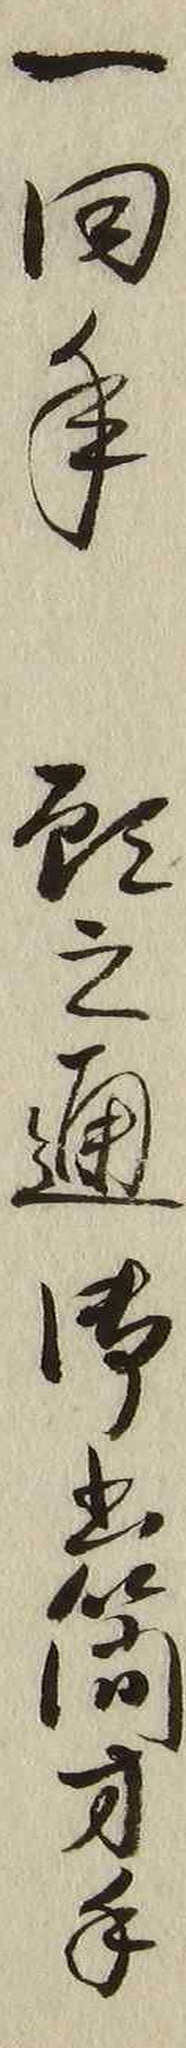一同年願之通御書簡方手
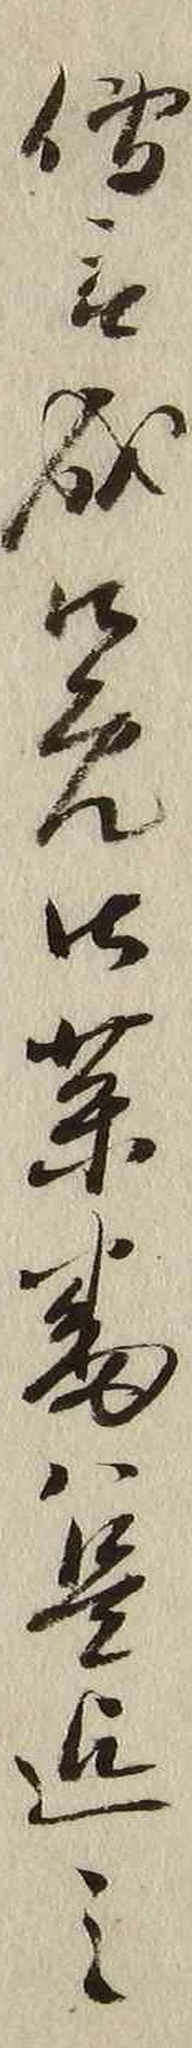伝被成御免御薬番ハ是迄之
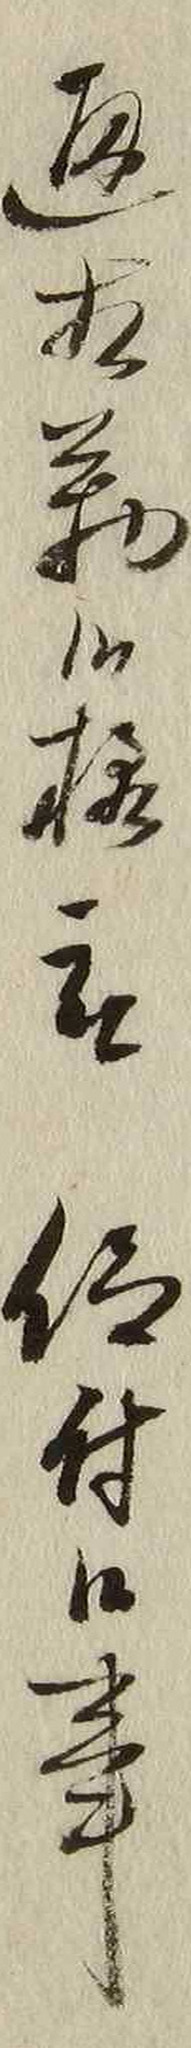通相勤候様被仰付候事
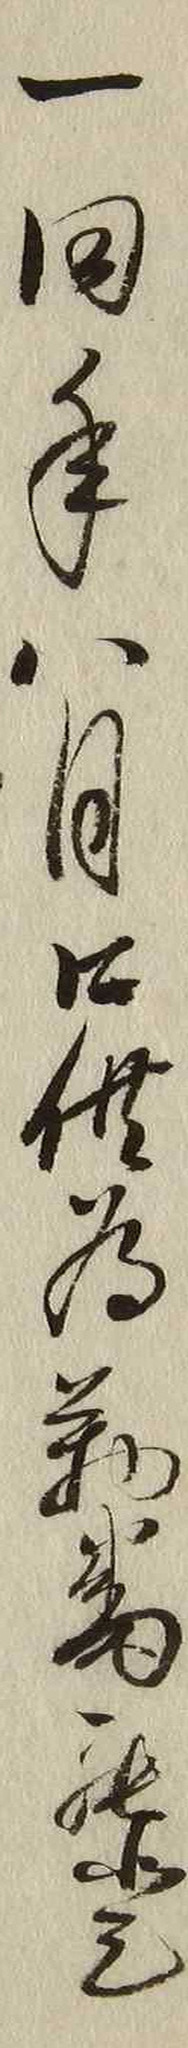一同年八月御供為勤番罷登
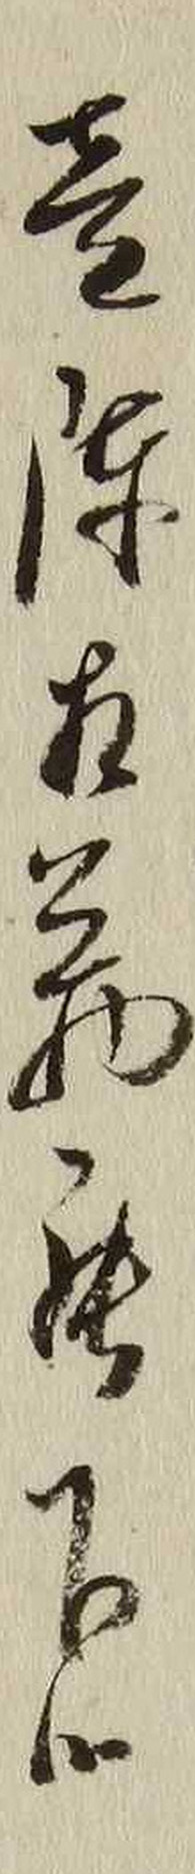壱陣相勤罷下候
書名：諸士系譜　巻之355　す之部5
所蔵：会津若松市立会津図書館
